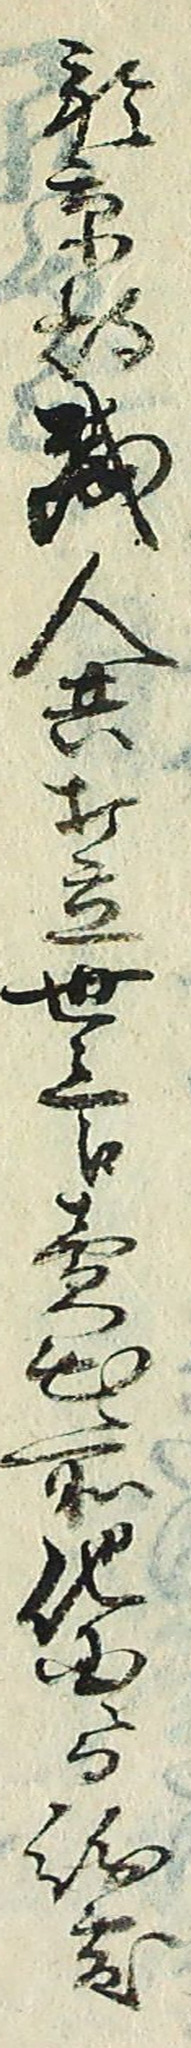於京都職人共打立世上江売出候所他国に而紛敷
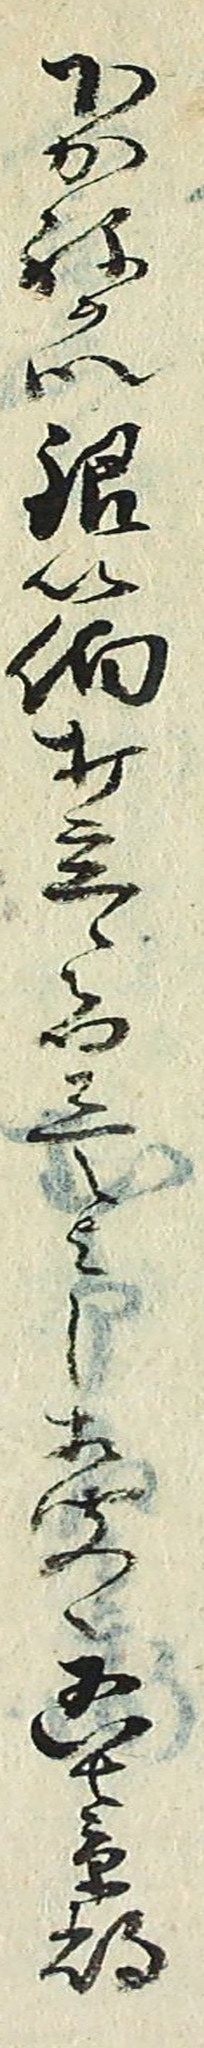下かねを以銀箔打立候者有之よし相聞候右は京都
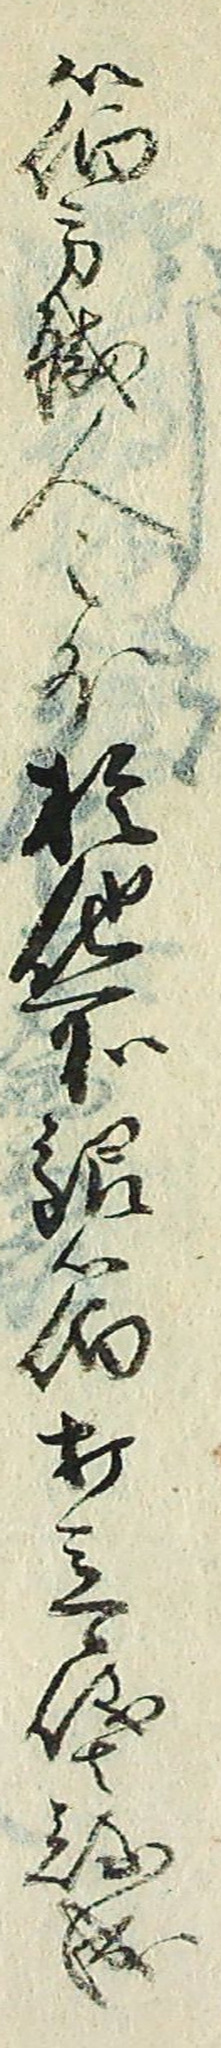箔方職人之外於他所銀箔打立候儀は難成
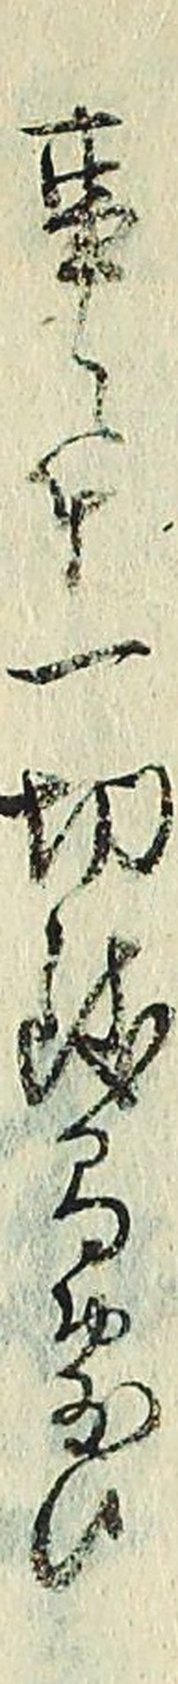事に付一切致間敷候
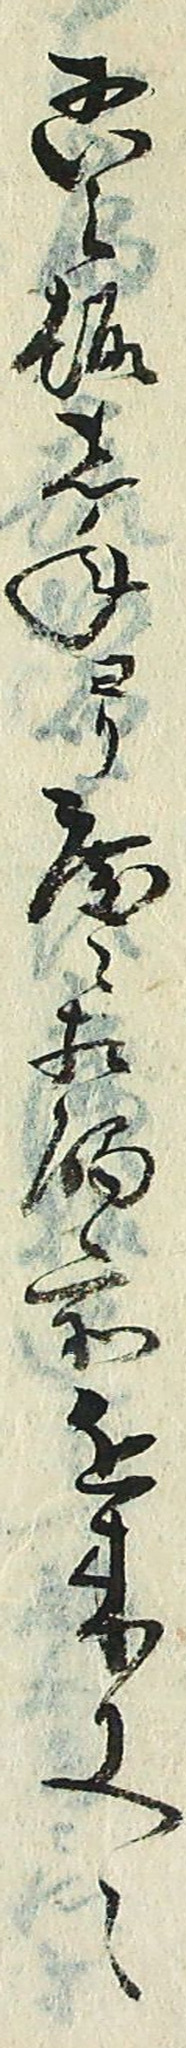右之趣先年より度々相触候所近来又々
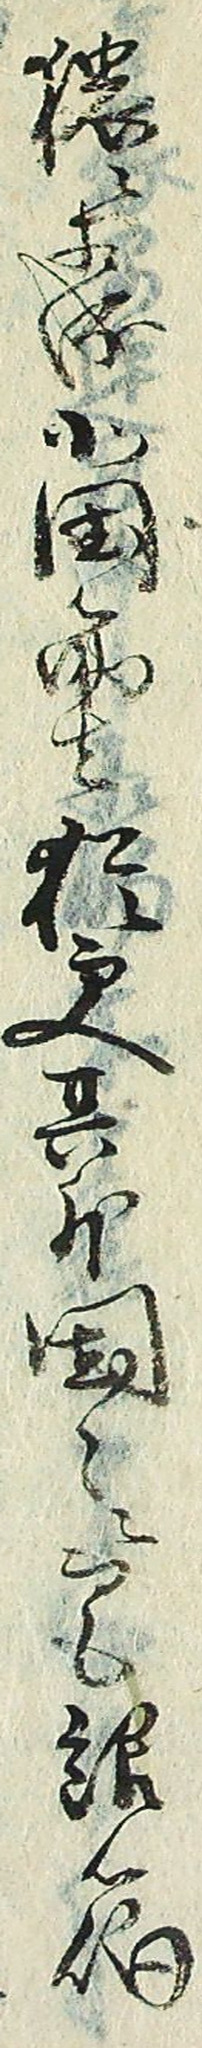猥に相成北国筋は猶更其外国々に而も銀箔
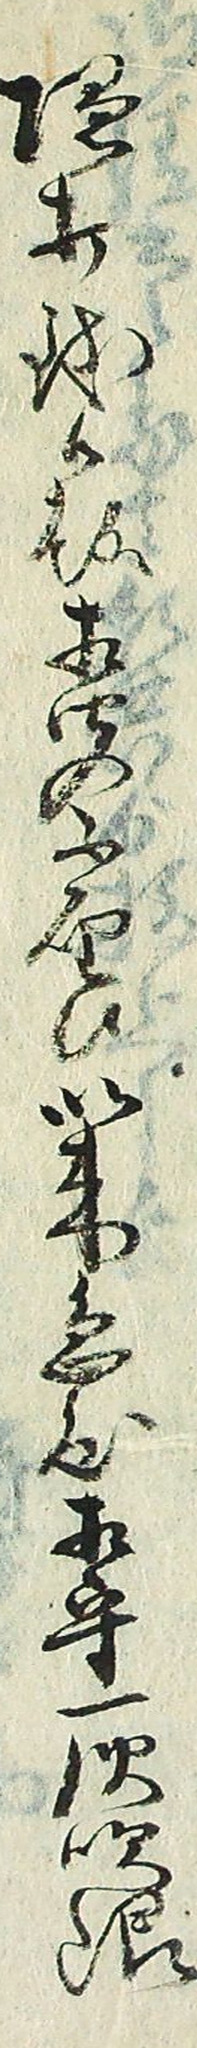隠打致候趣相聞不届候以来急度相守灰吹銀
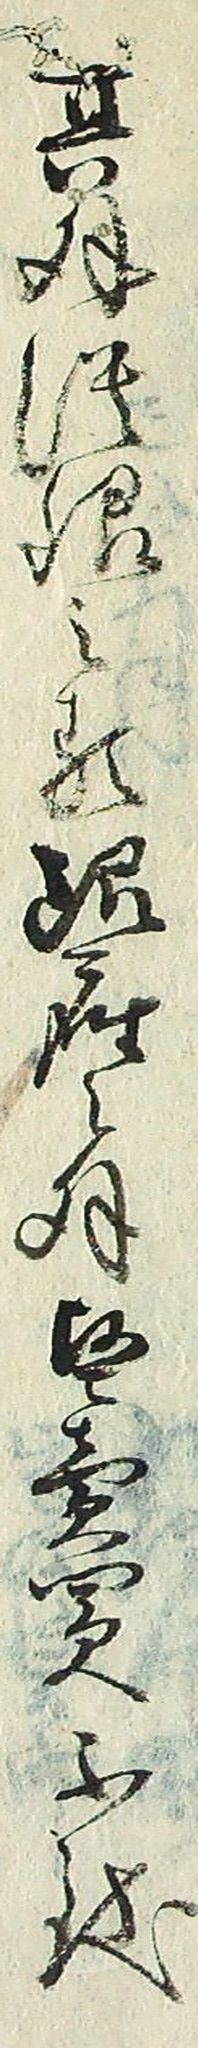其外潰銀之類銀座之外堅売買不致
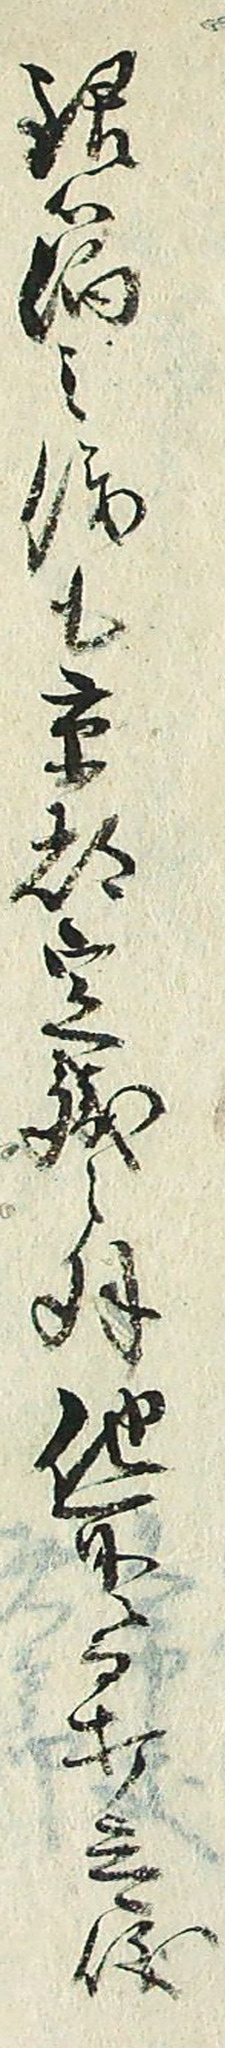銀箔之儀も京都定職之外他所に而打立候儀
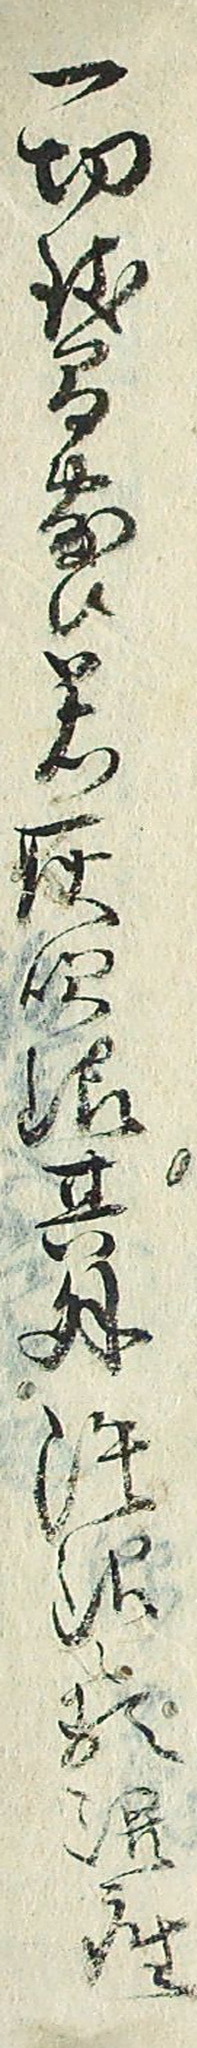一切致間敷候若灰吹銀其外潰銀之類銀座

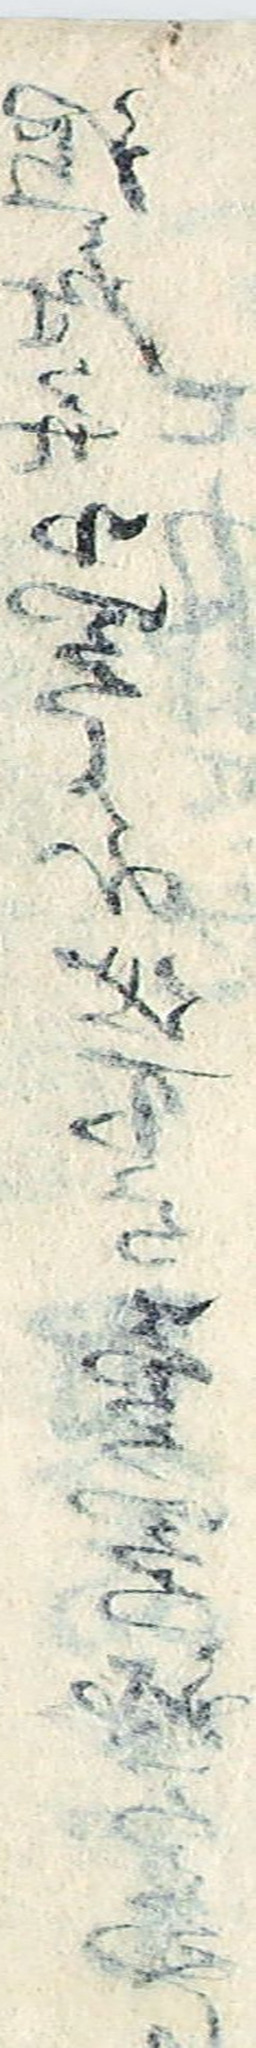八月十一日
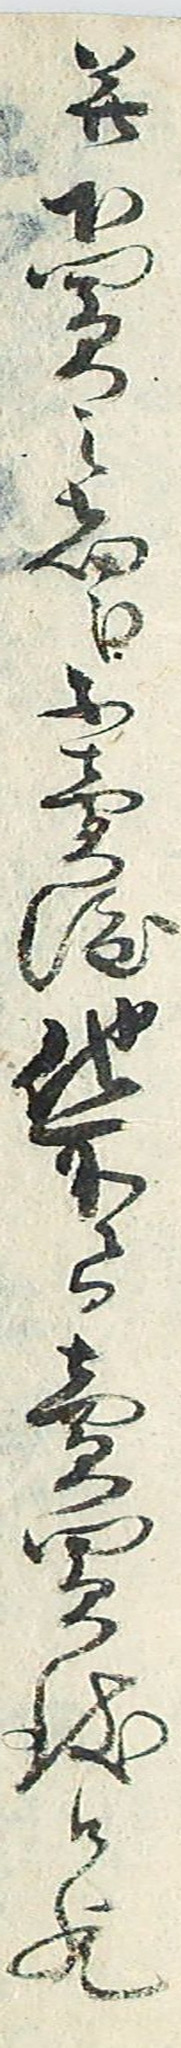幷下買之者江不売渡他所にて売買致候歟
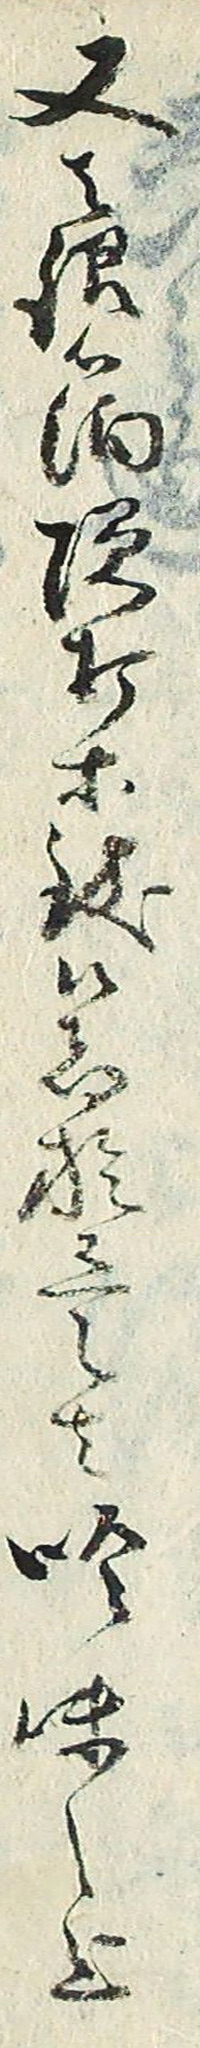又は銀箔隠打等致候者於有之は吟味之上
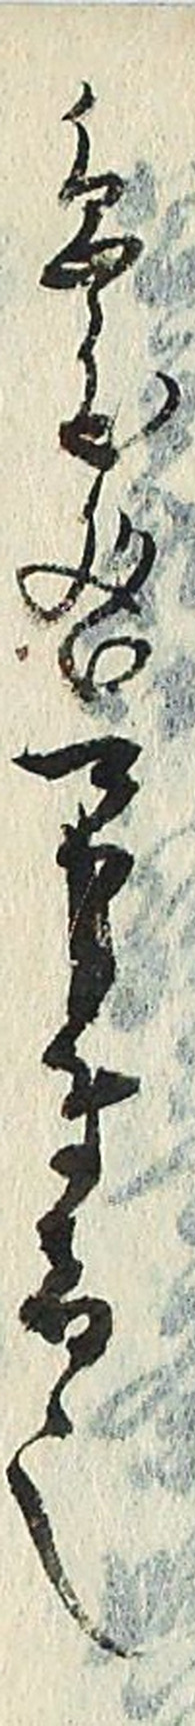急度咎可申付者也
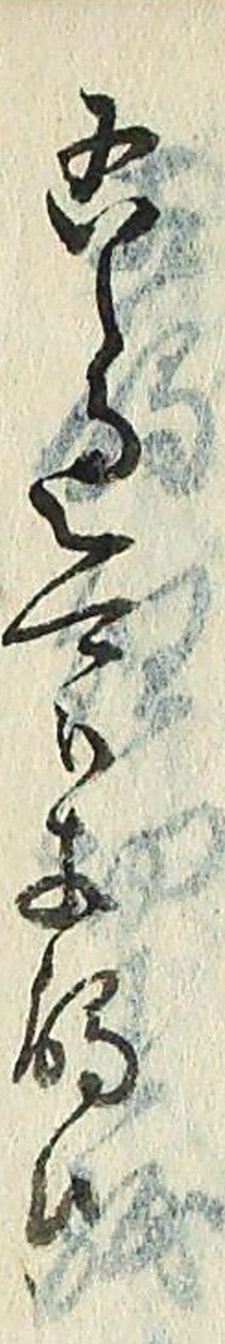右之通可被相触候
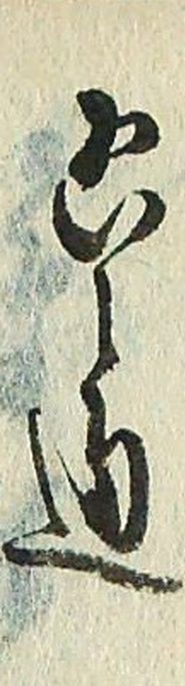右之通
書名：諸御用御□受書控
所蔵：鳴門教育大学 Naruto University of Education
